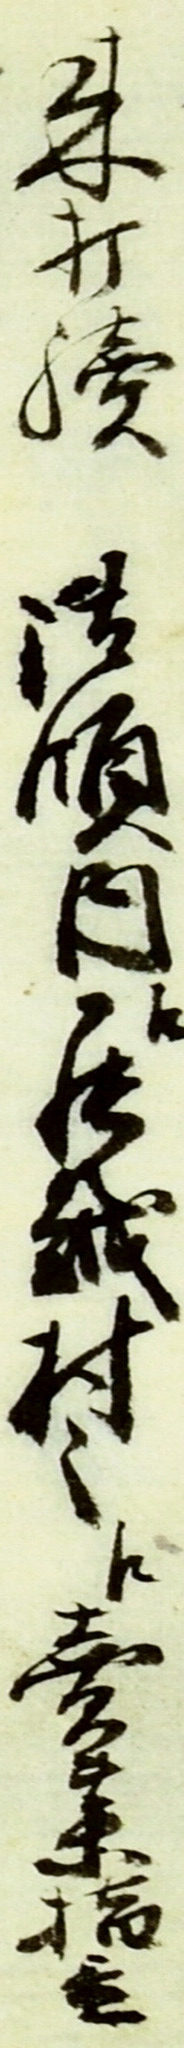来打続御領内江罷越村々江売薬指置
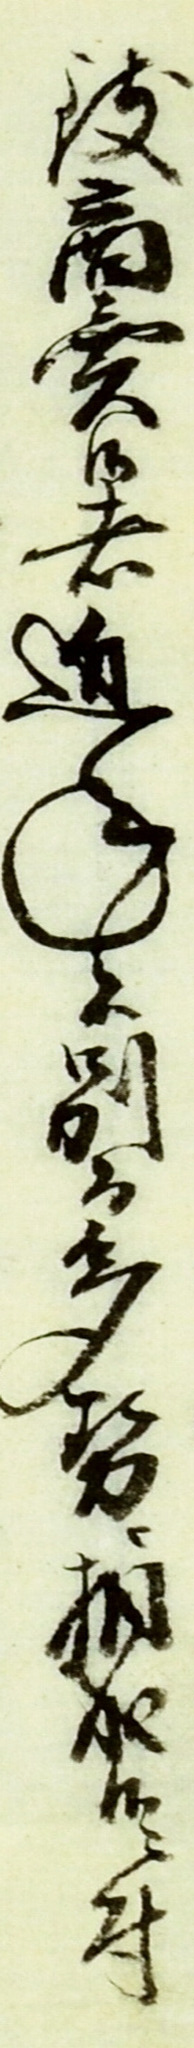致商売候者近年者別而多勢ニ相成候ニ付
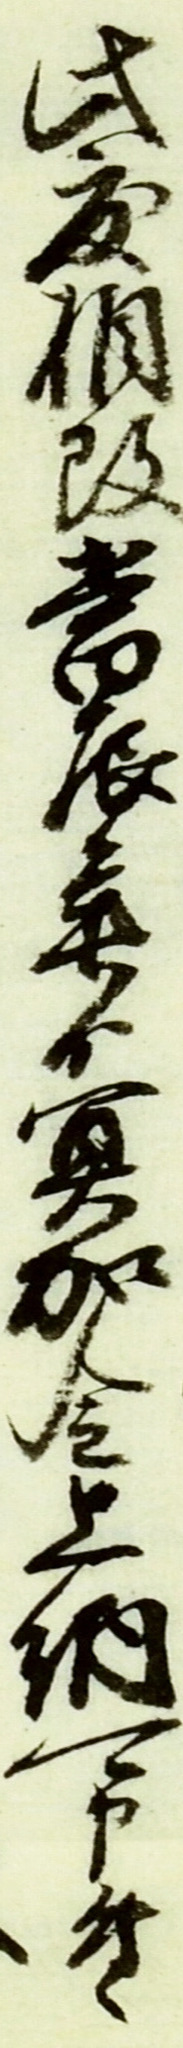此度相改当辰年ゟ冥加金上納可申付候
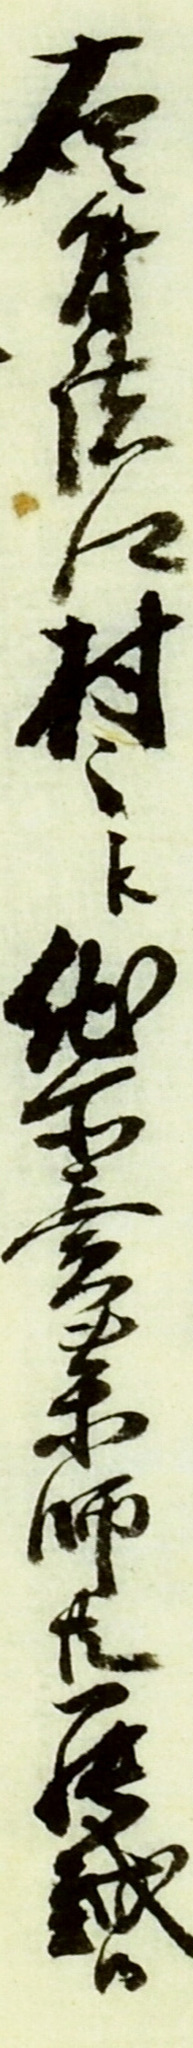右ニ付諸郷村々江他所売薬師共罷越候
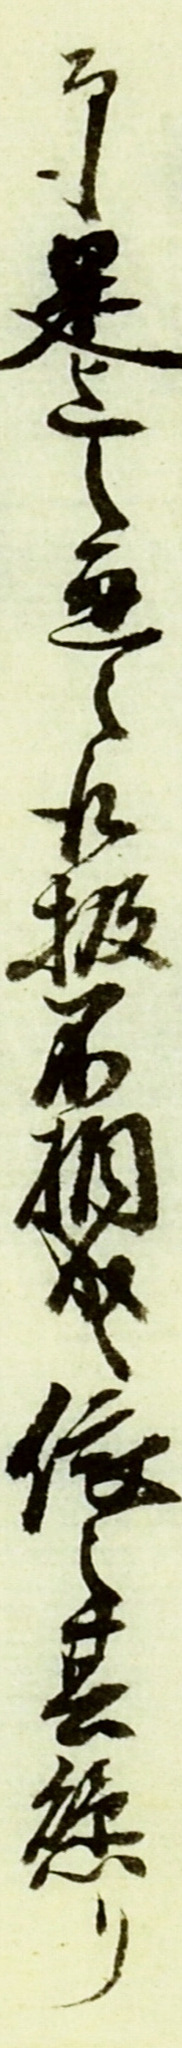而も是迄之通之取扱不相成候依之其懸り
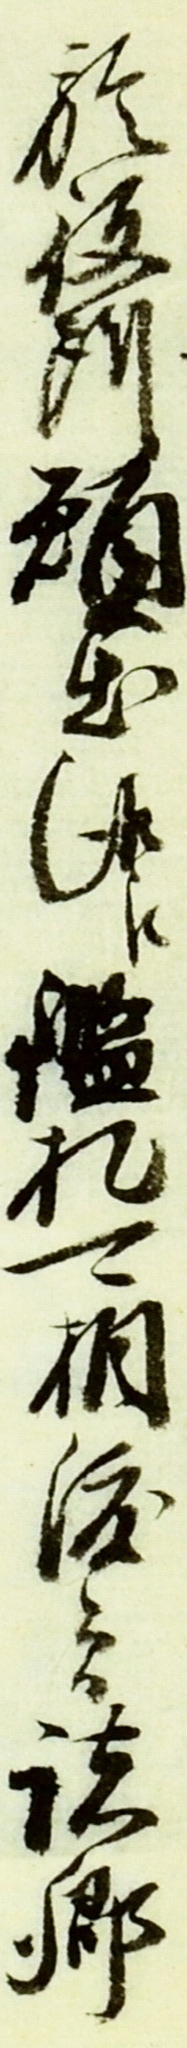於役所願出趣江鑑札可相渡候間諸郷
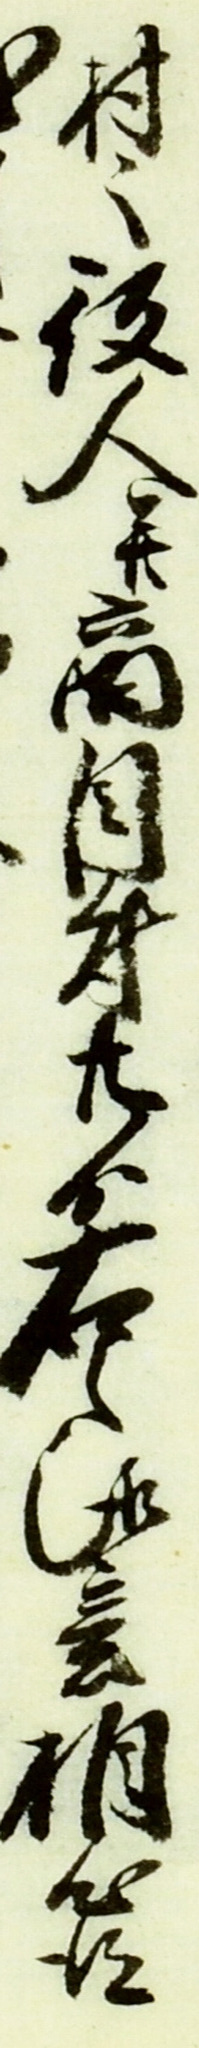村々役人并商目付共ゟ右之趣意相心得
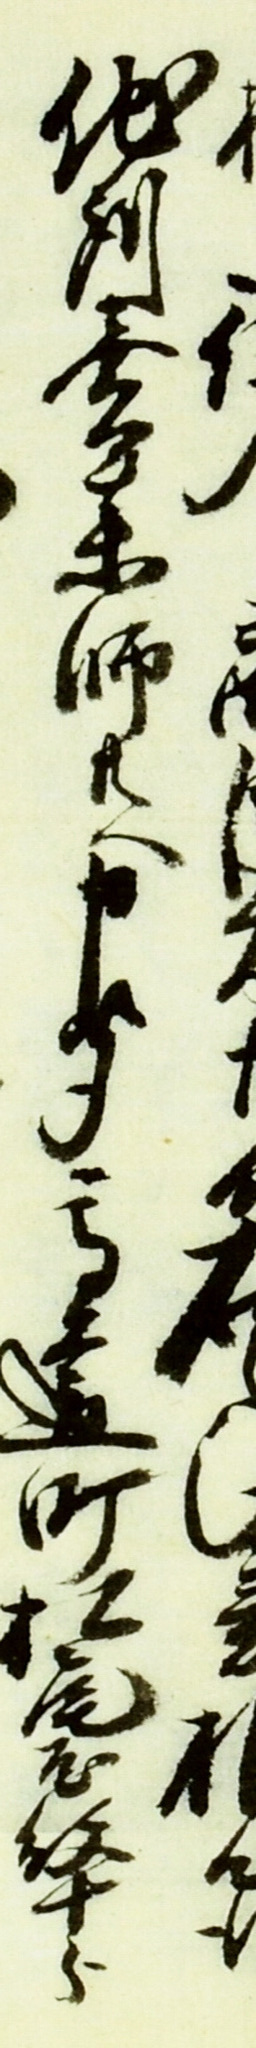他所売薬師共へ申聞高遠町松尾屋紋十郎
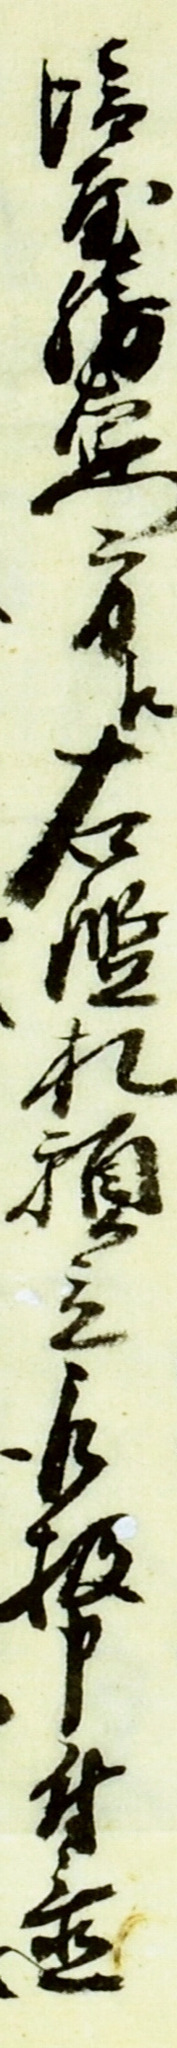塩屋勝右衛門方江右鑑札願立取扱申付置候
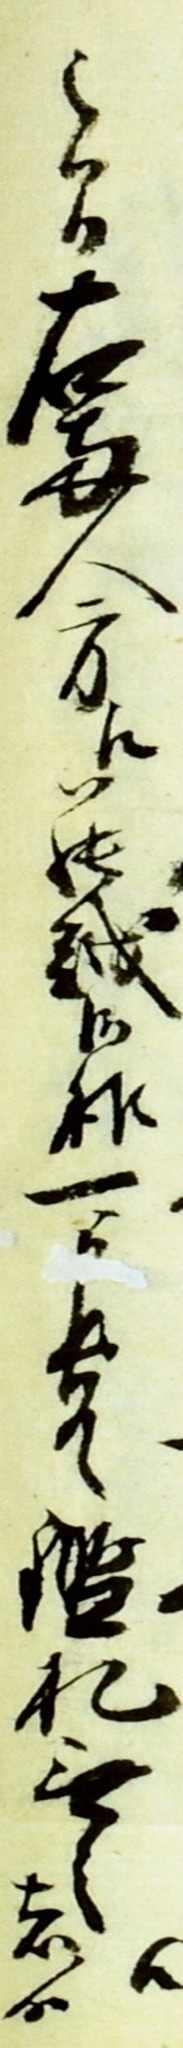之間右両人方江罷越候様可申聞候鑑札無之者ゟ
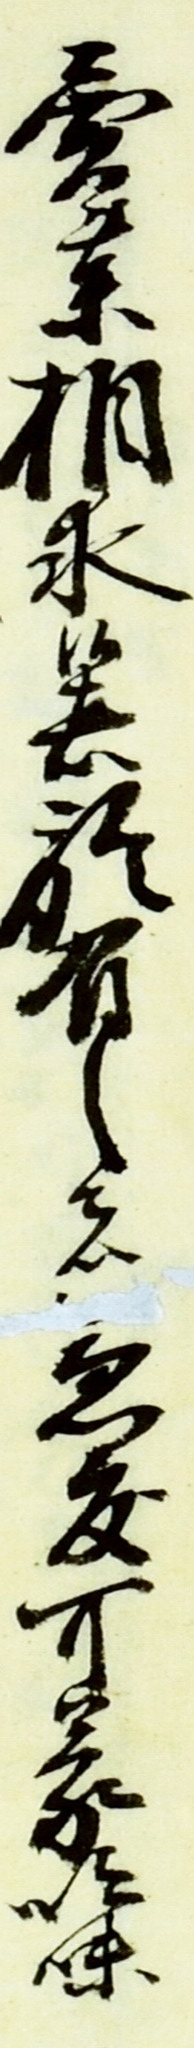売薬相永候者於有之者急度可蒙吟味
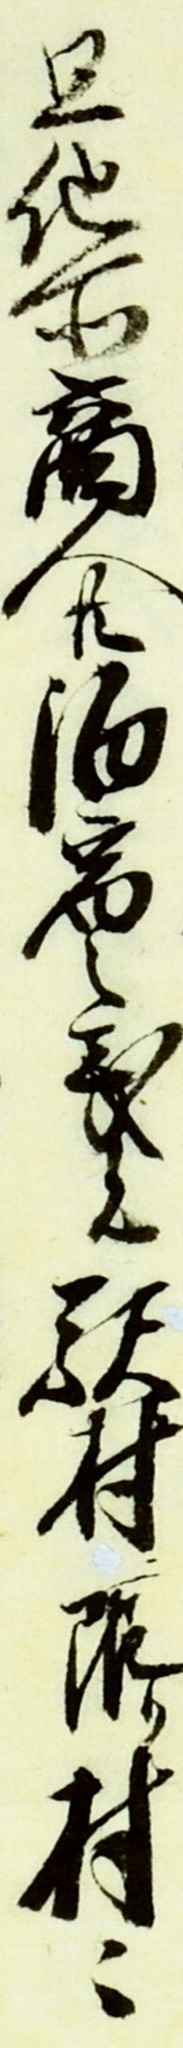且他所商人共泊宿之義者駅村ニ限り村々
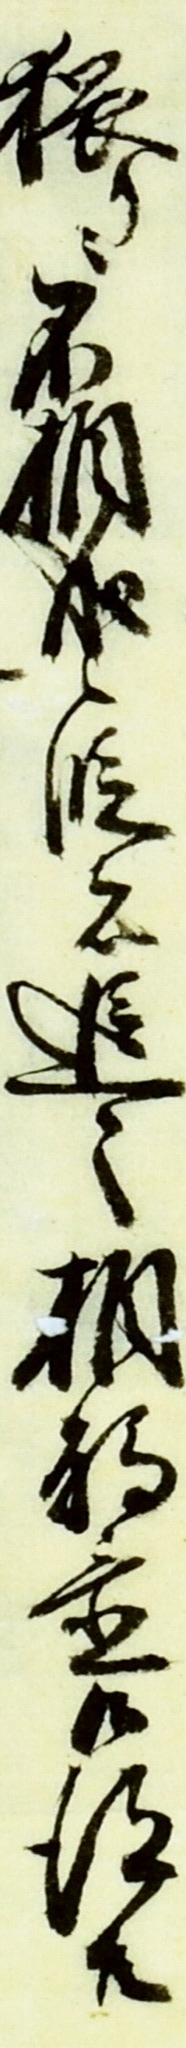猥りニ不相成候段者追々相触置候得共
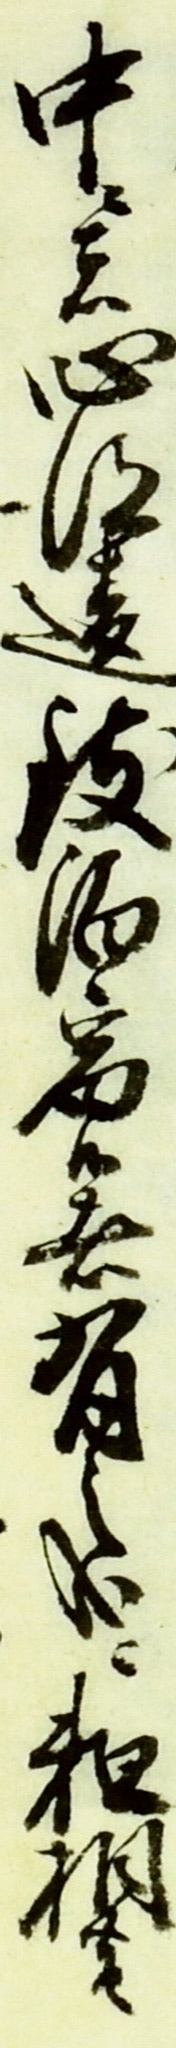中ニ者心得違致泊宿候者有之哉ニ粗相者
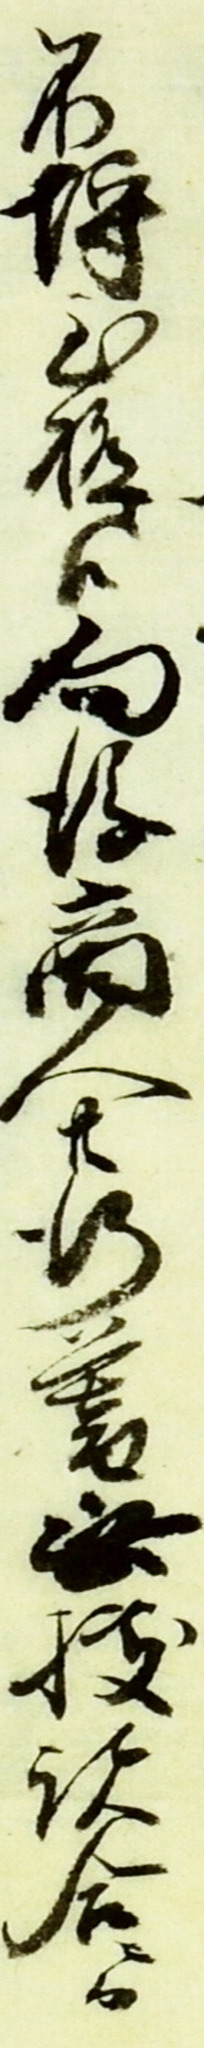不埒至極候向後商人共行暮無拠訳合ニ而
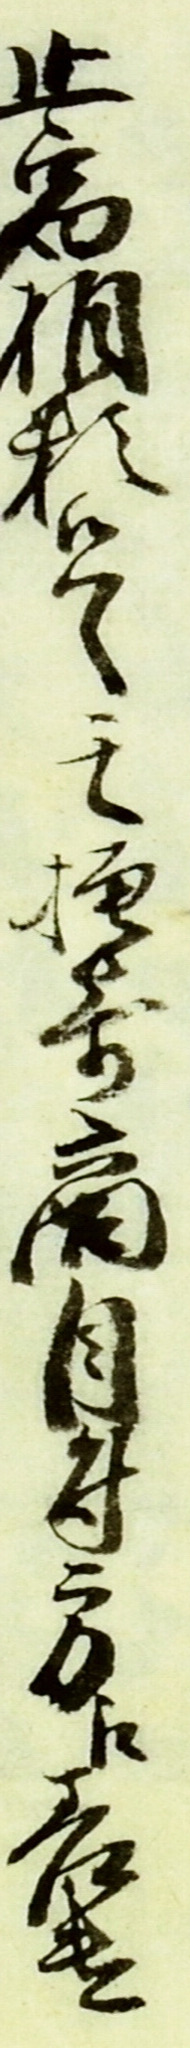止宿相頼候ハヽ其模寄商目付方江差遣
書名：他国賣薬師運上之事
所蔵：伊那市立高遠町図書館・合同会社AMANE
